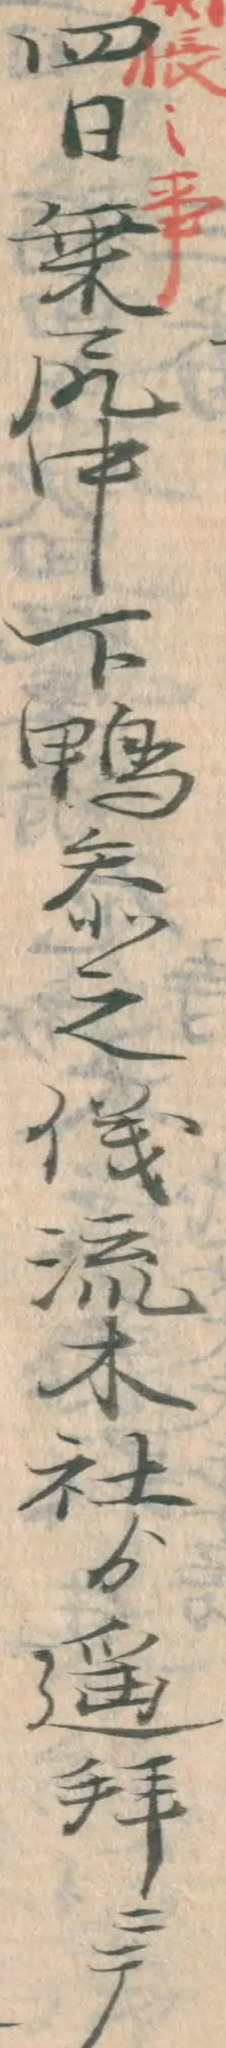四日乗尻中下鴨参之儀流木社ゟ遥拝ニテ
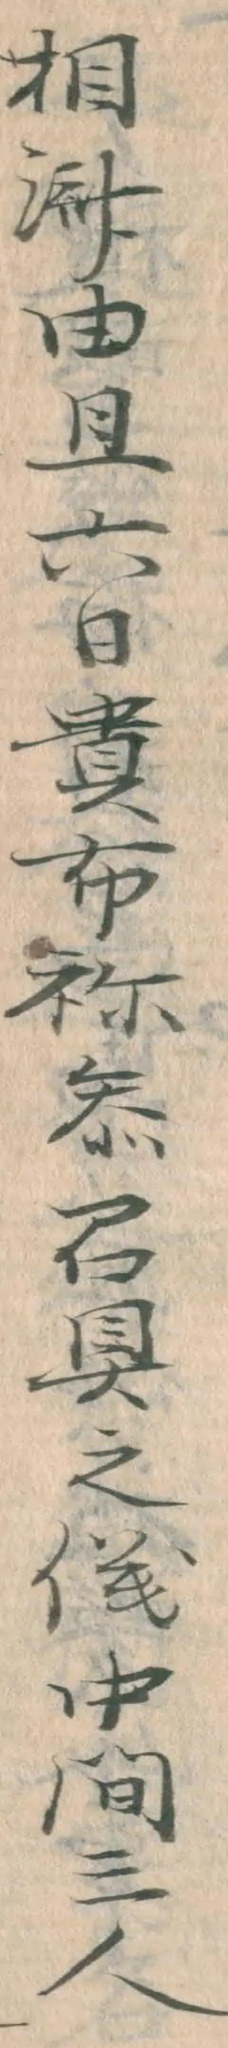相済由且六日貴布祢参召具之儀中間三人
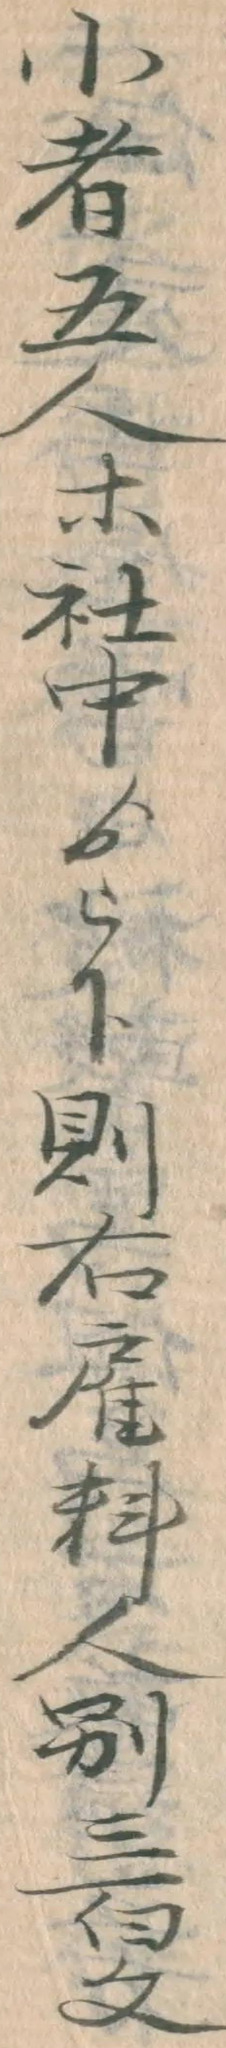小者五人等社中ゟ被下則右雇料人別三百文
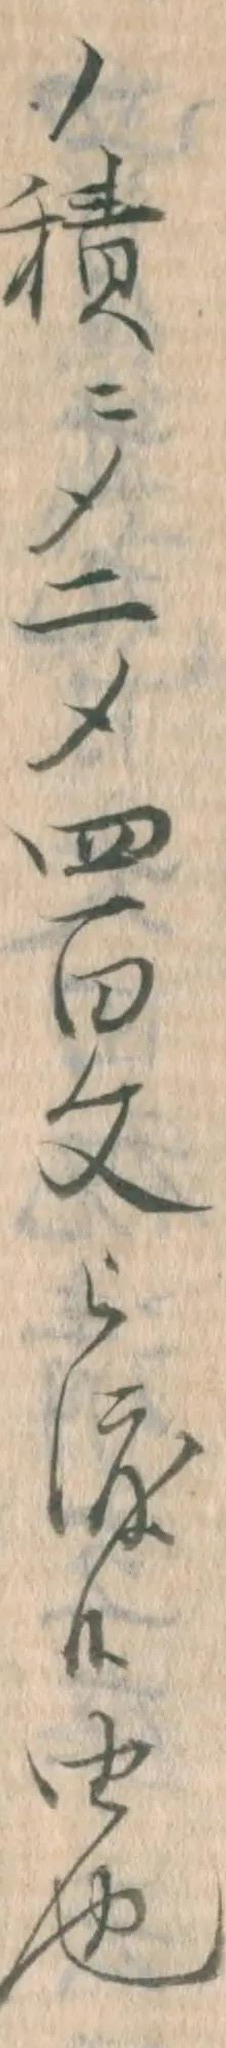ノ積ニシテ二〆四百文被渡候由也
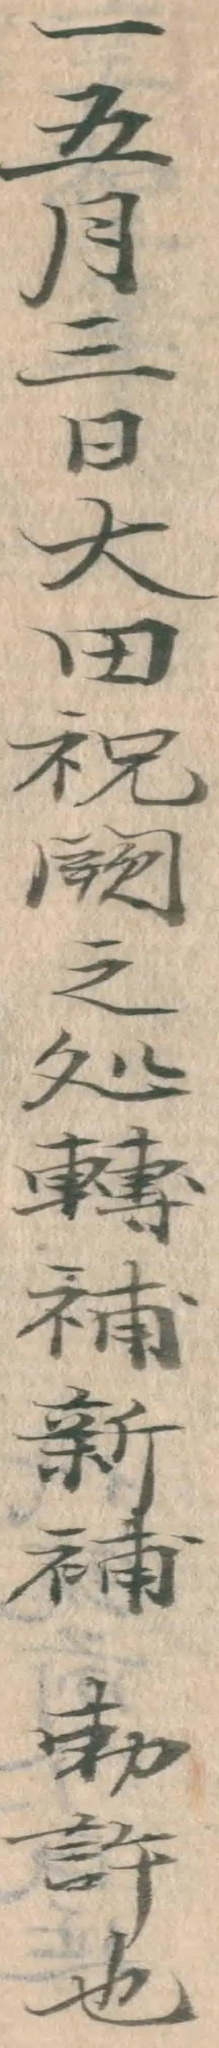一五月三日大田祝闕之処転補新補勅許也
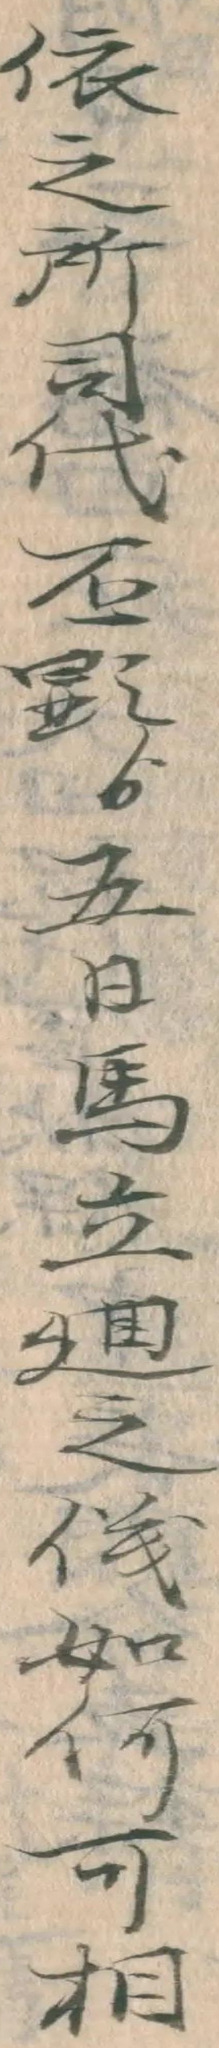依之所司代丕顕ゟ五日馬立廻之儀如何可相
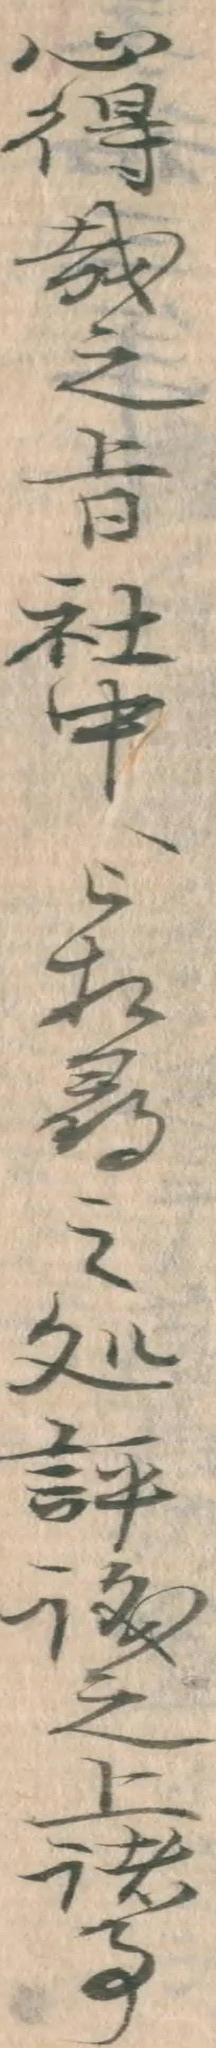心得哉之旨社中へ被相尋之処評議之上諸事
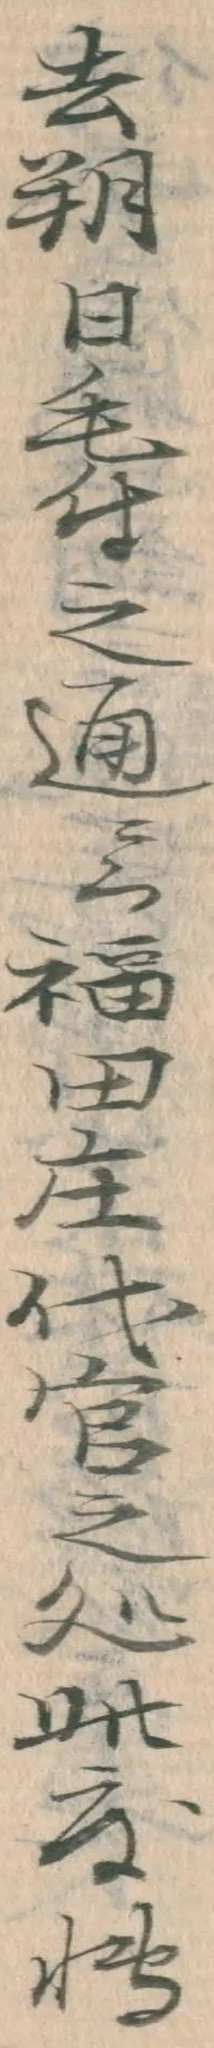去朔日毛付之通ニ而福田庄代官之処此度転
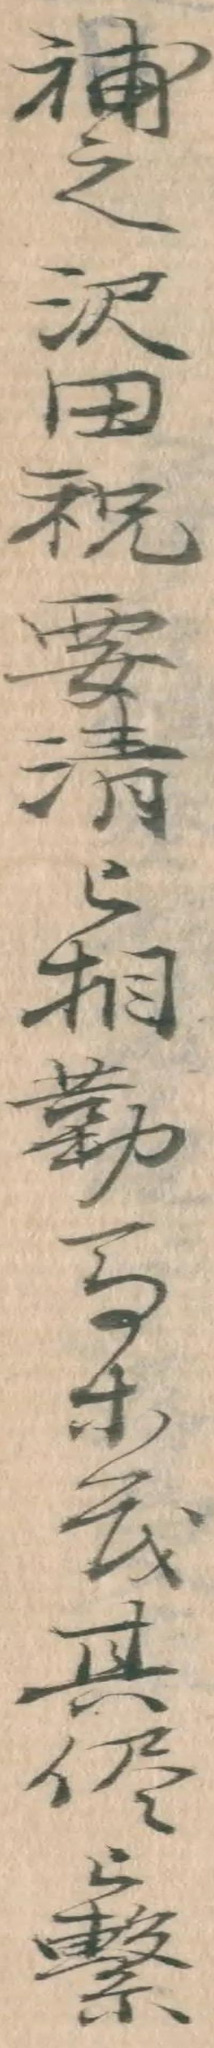補之沢田祝要清被相勤馬等茂其侭被繋
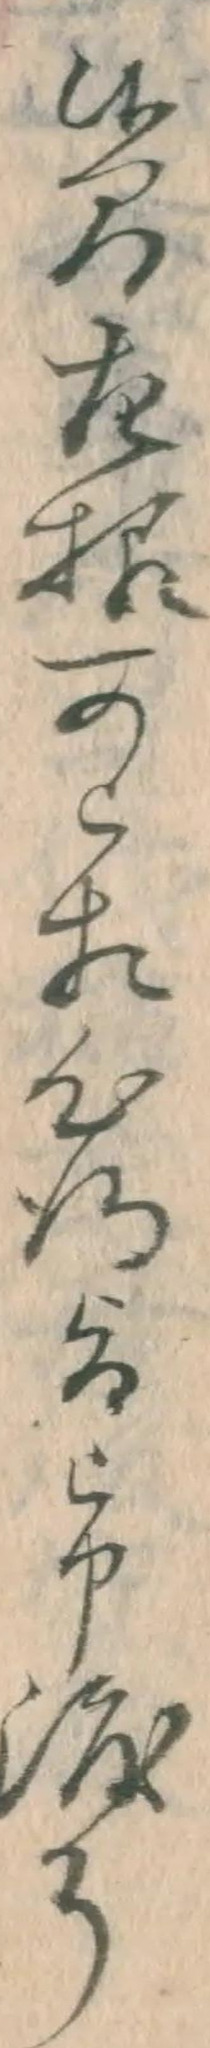候間左様可被相心得旨被申渡了
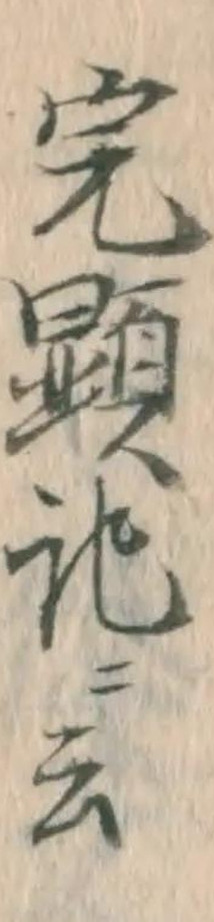完顕記ニ云
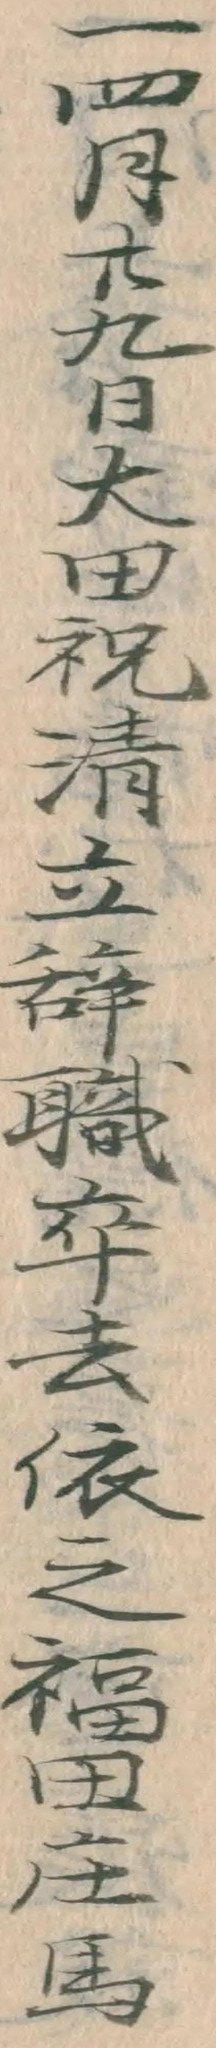一四月廿九日大田祝清立辞職卒去依之福田庄馬
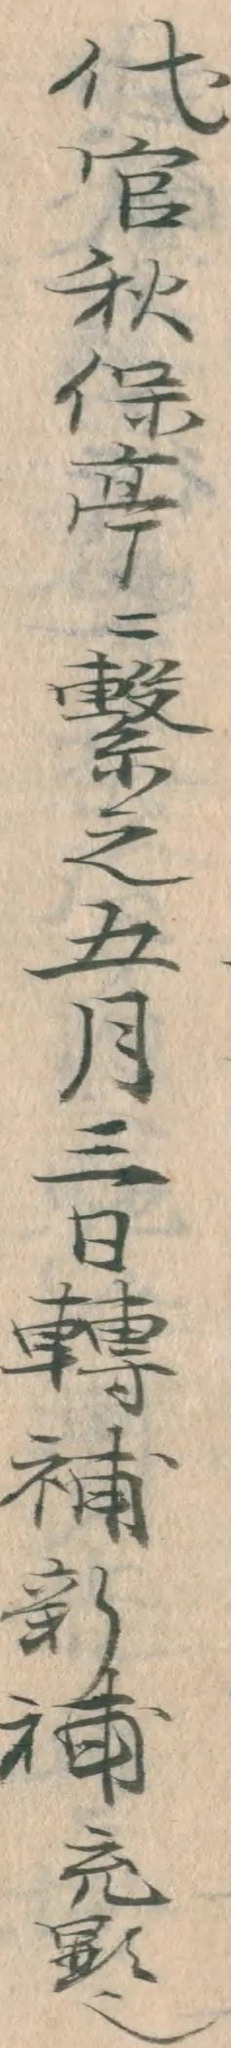代官秋保亭ニ繋之五月三日転補新補充顕也
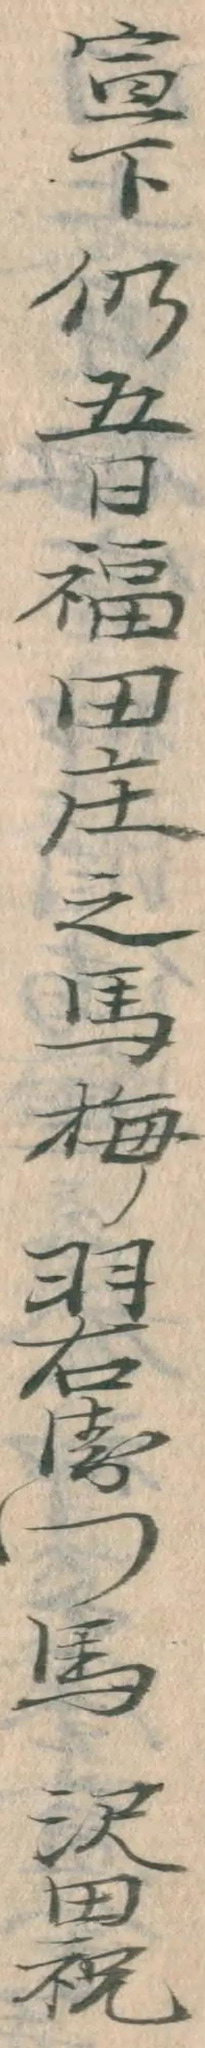宣下仍五日福田庄之馬梅ノ羽右衛門馬沢田祝
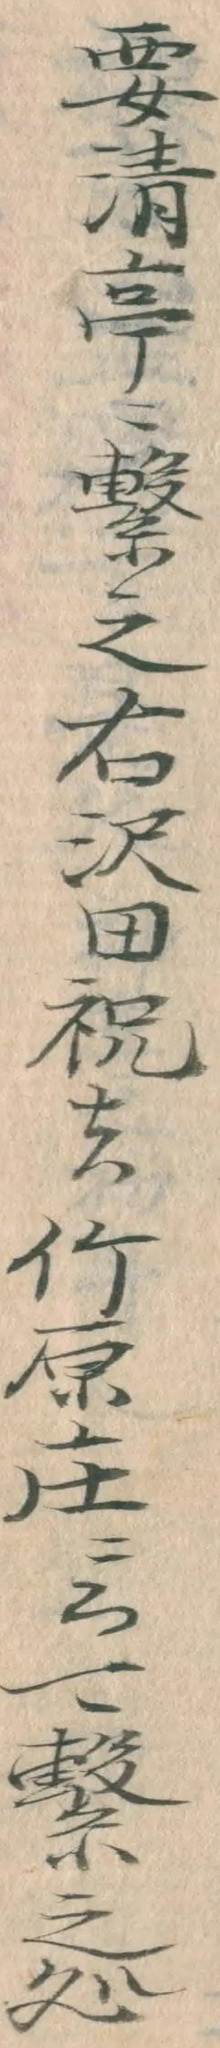要清亭ニ繋之右沢田祝者竹原庄ニ而可繋之処
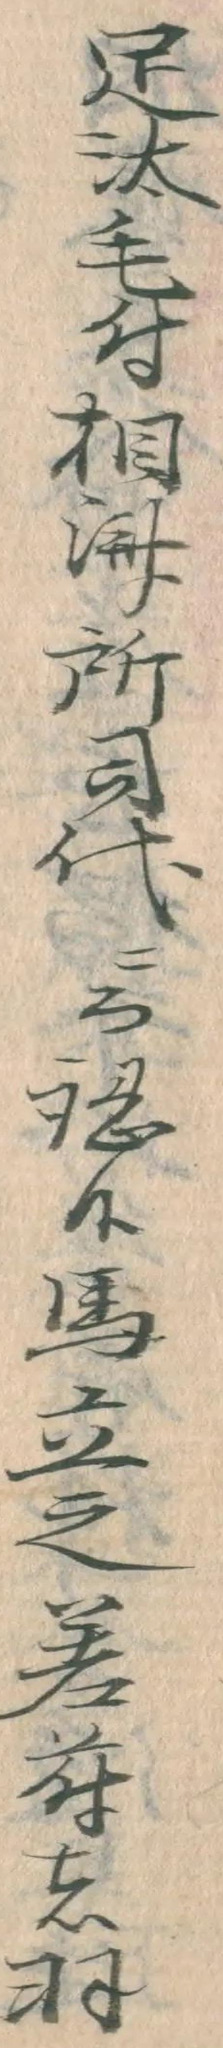足汰毛付相済所司代ニ而認候馬立之差苻者羽
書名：賀茂社記録. 第10冊
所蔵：国立国会図書館 National Diet Library, JAPAN
